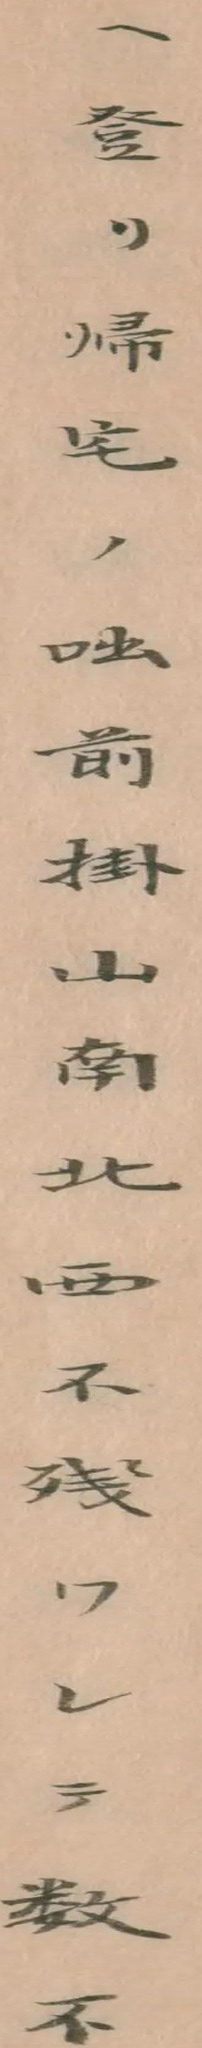へ登り帰宅ノ咄前掛山南北西不残ワレテ数不
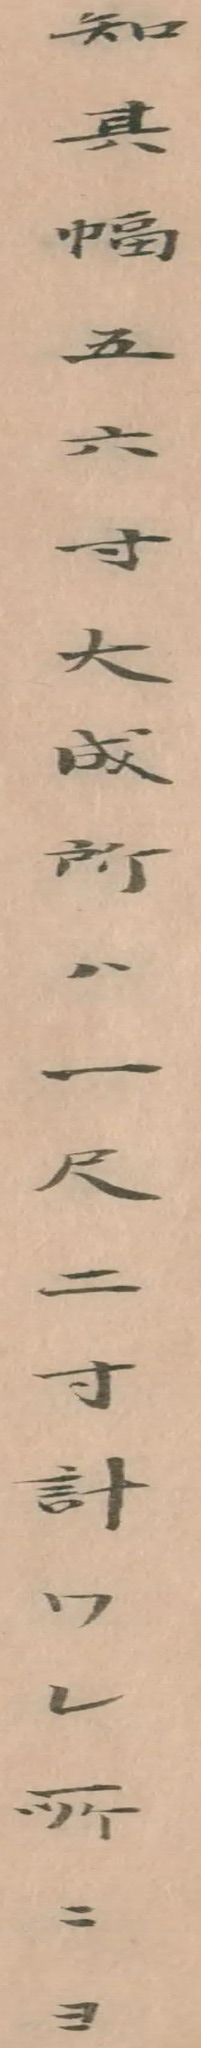知其巾五六寸大成所ハ一尺二寸計ワレ所二ヨ
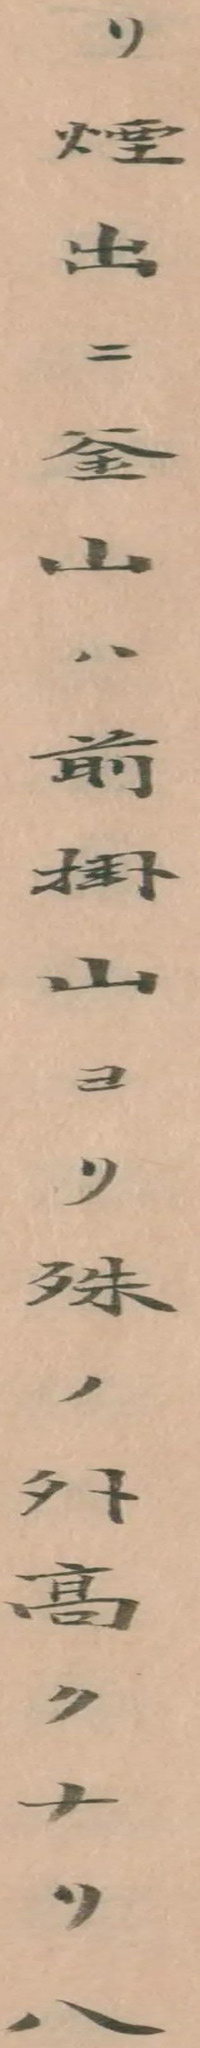り煙出二釜山ハ前掛山ヨリ殊ノ外高クナリ八

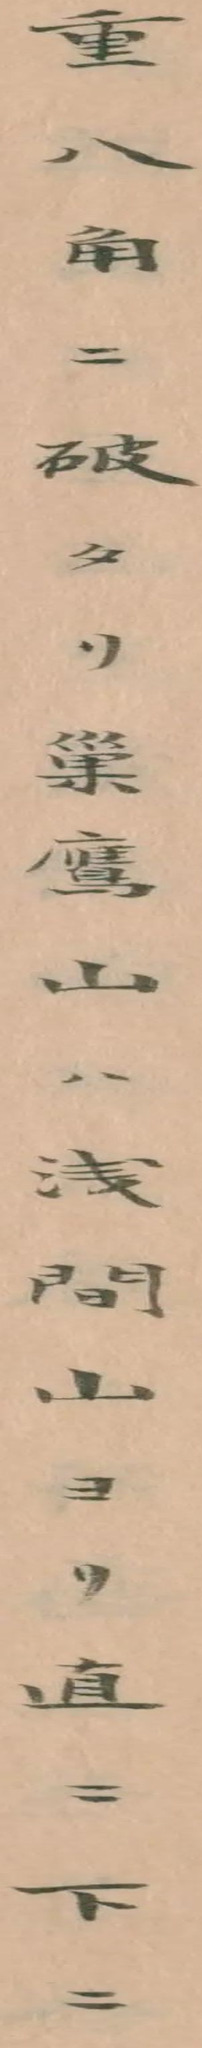重八角二破タリ巣鷹山ハ浅間山ヨリ直二下二
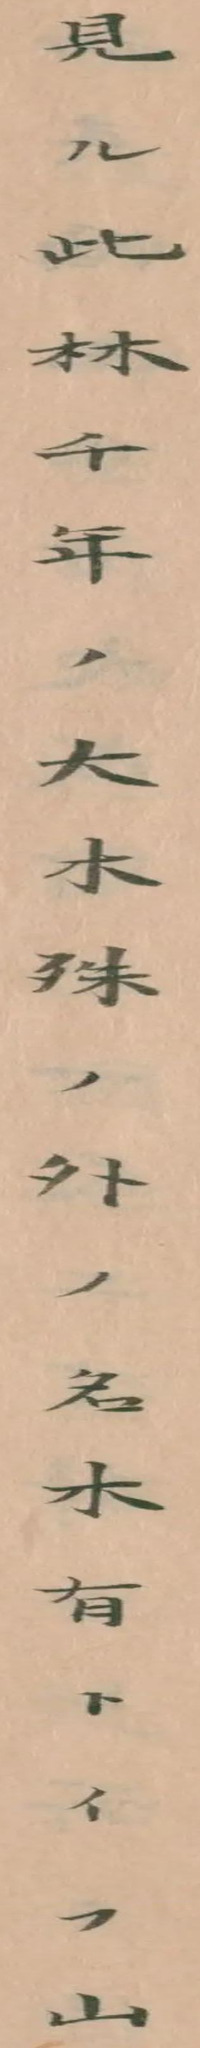見ル此林千年ノ大木殊ノ外ノ名木有トイフ山
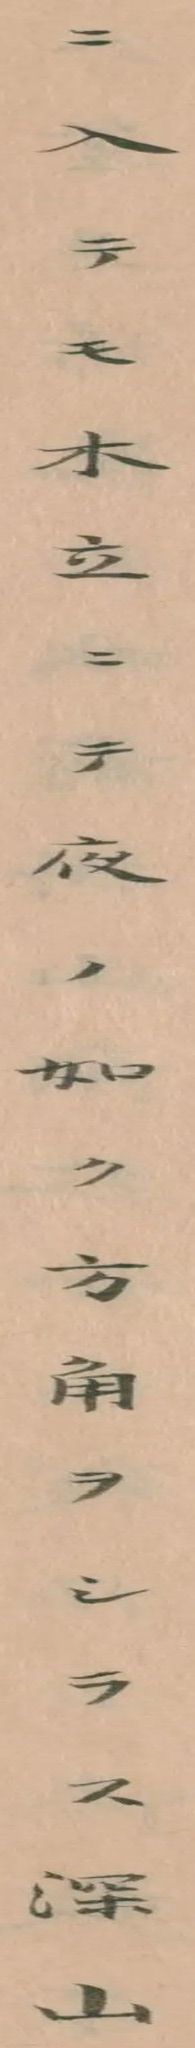二入テモ木立ニテ夜ノ如ク方角ヲシラス深山
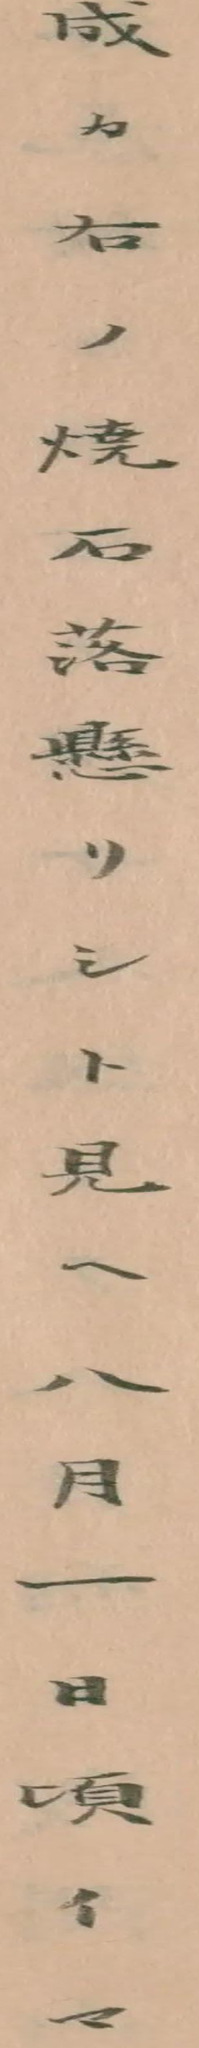成カ右ノ焼石落懸リシト見へ八月一日頃イマ
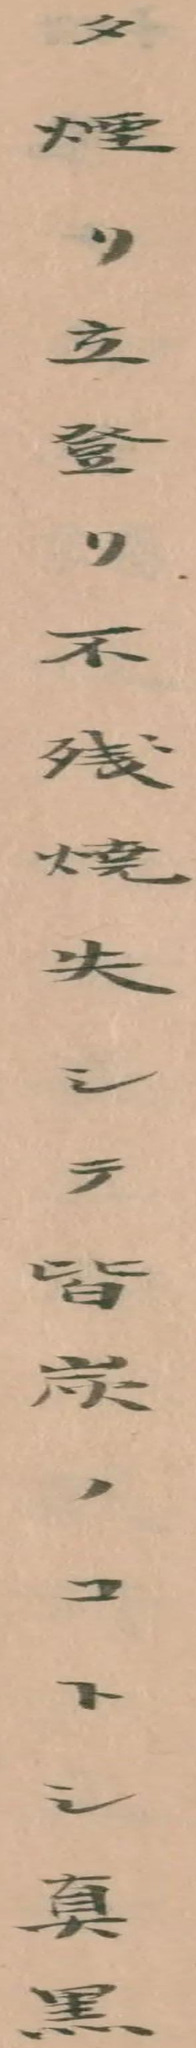タ煙り立登り不残焼失シテ皆炭ノコトシ真黒
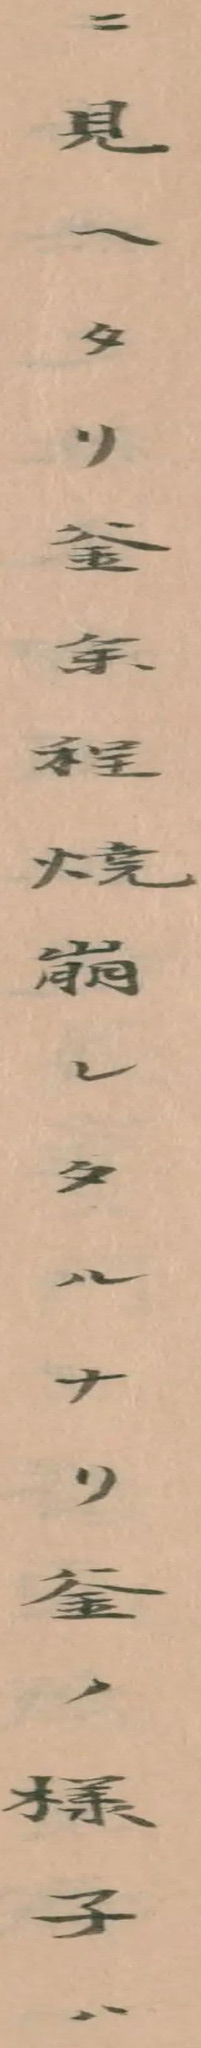二見ヘタリ釜余程焼崩レタルナリ釜ノ様子ハ
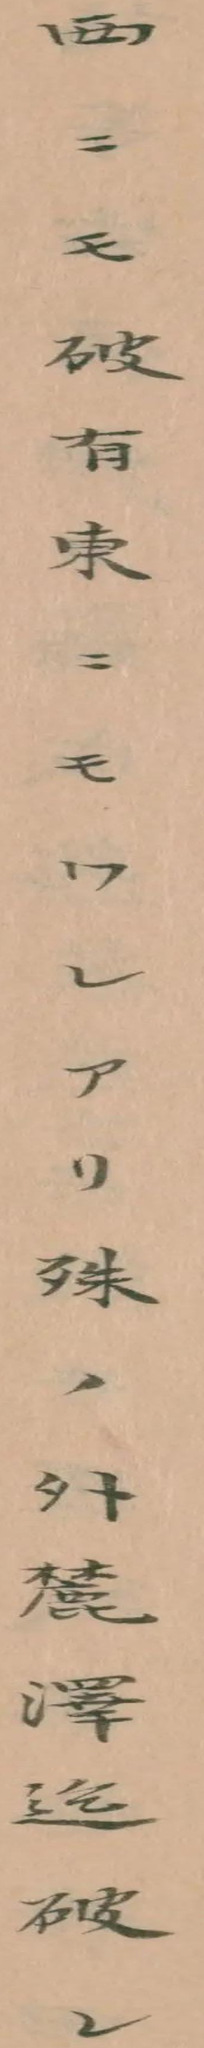西ニモ破有東ニモワレアリ殊ノ外麓澤迄破レ
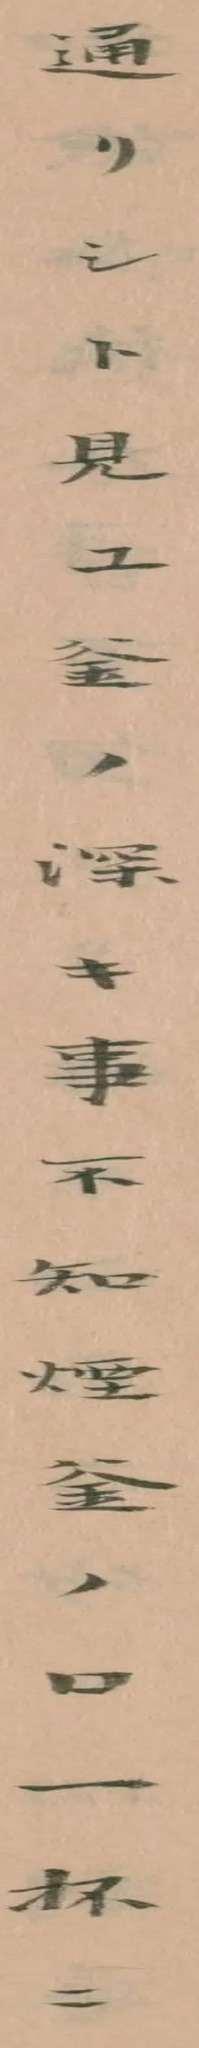通リシト見ユ釜ノ深キ事不知煙釜ノ口一杯二
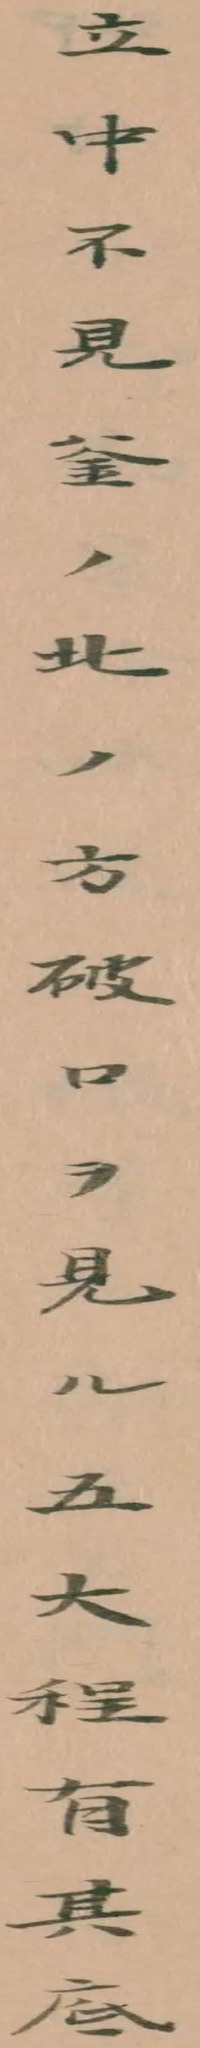立中不見釜ノ北ノ方破口ヲ見ㇽ五大程有其底
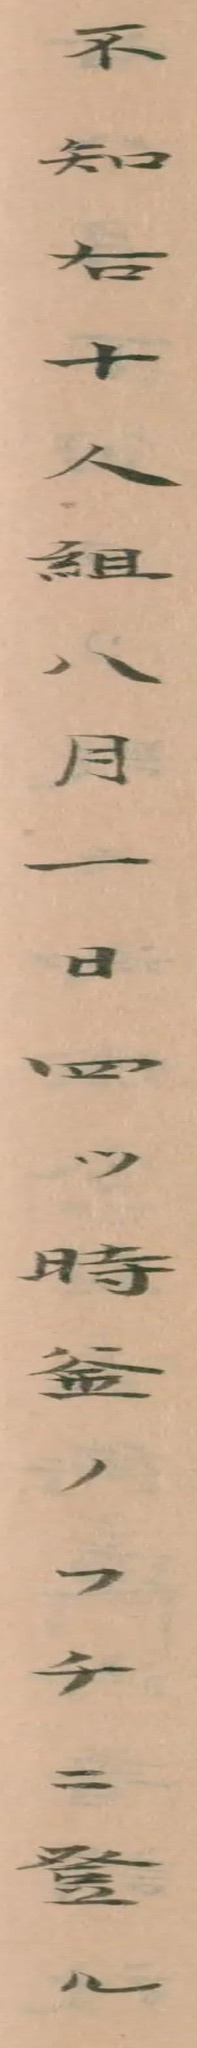不知右十人組八月一日四ッ時釜ノフチ二登ル
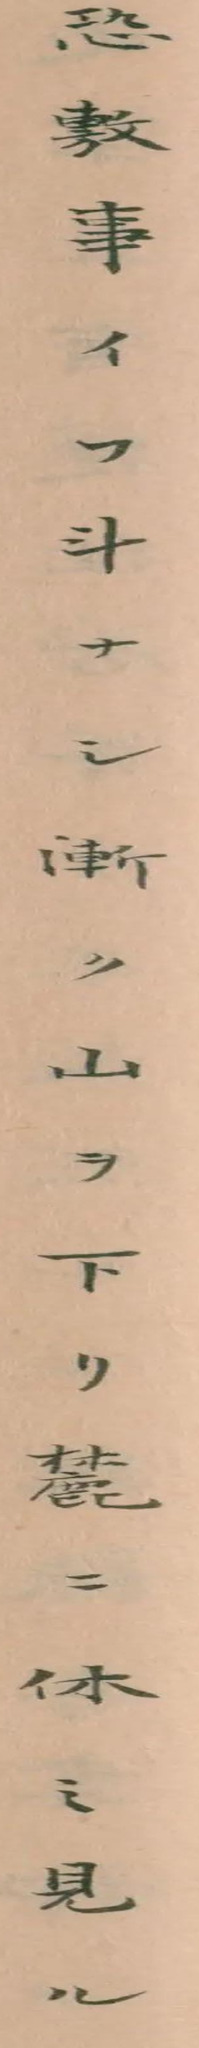恐敷事イフ斗ナシ漸ク山ヲ下り麓二休ミ見ㇽ
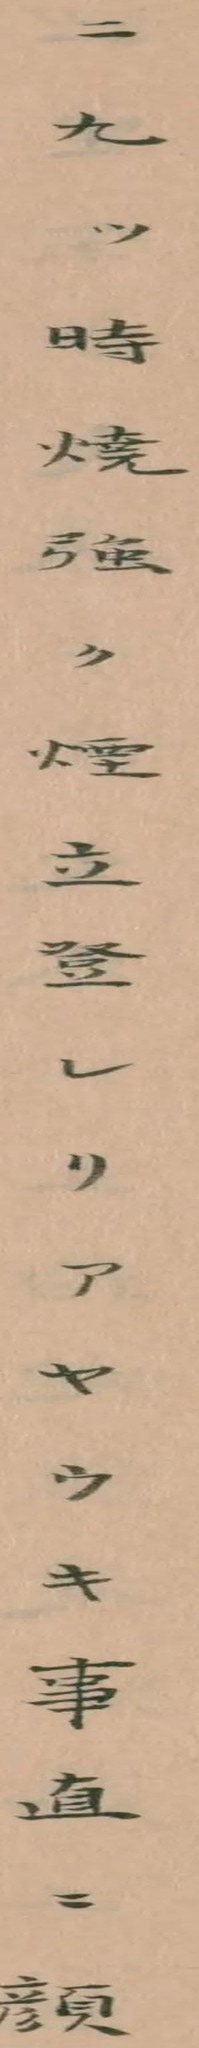二九ッ時焼強ク煙立登レりアヤウキ事直二顔
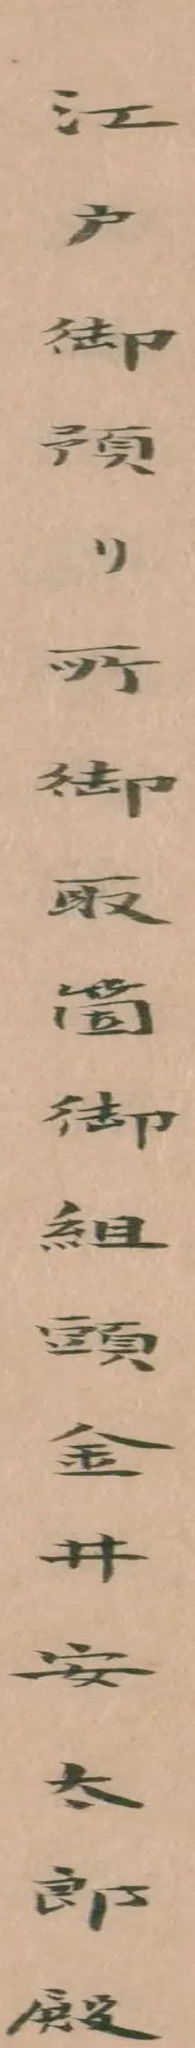江戸御預り所御取箇御組頭金井安太郎殿
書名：地災撮要. 巻3(地震之部)-巻4(噴火之部)
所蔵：国立国会図書館 National Diet Library, JAPAN
